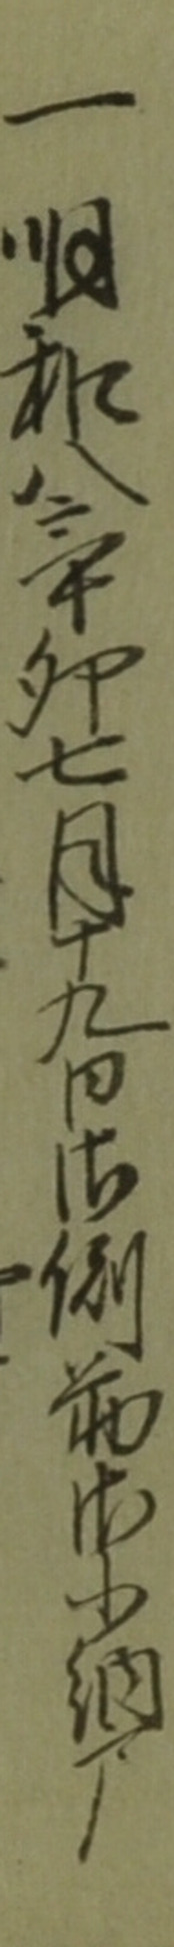一明和八辛卯七月十九御側勤御小納戸
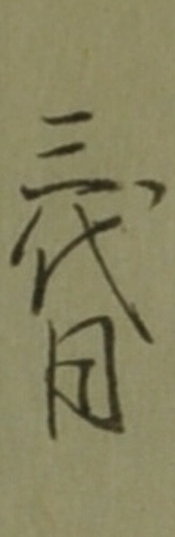三代目
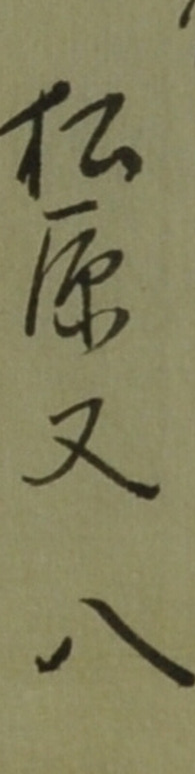松原又八
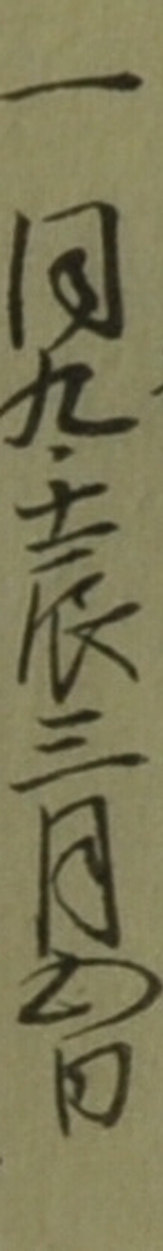一同九壬辰三月五日
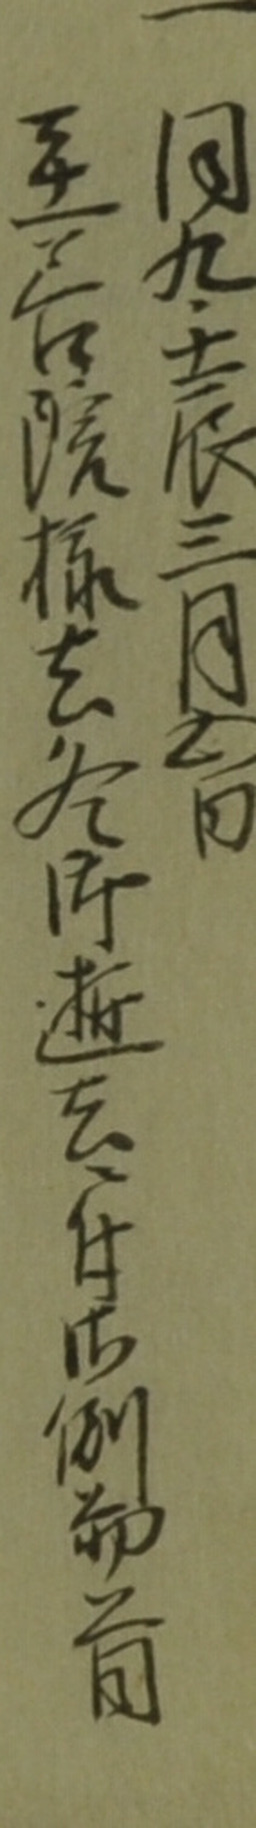一至善院様去冬御逝去ニ付御側勤首
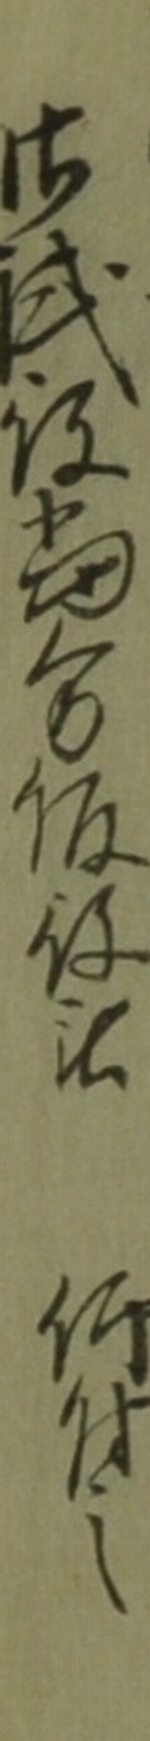御試役当分仮役被仰付之
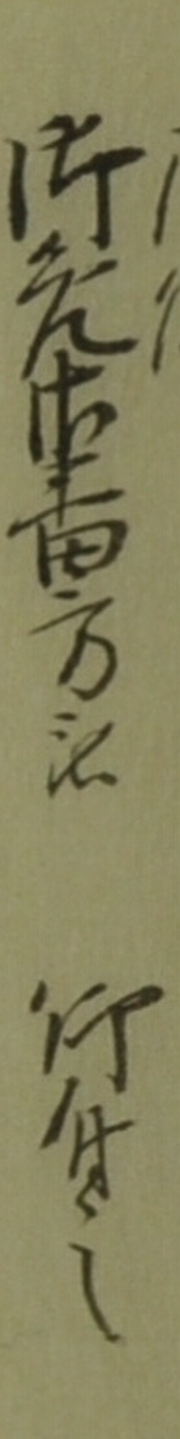一御免御番方被仰付之

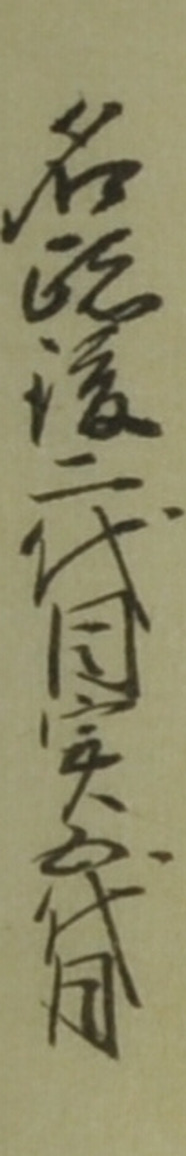名跡後二代目実五代目
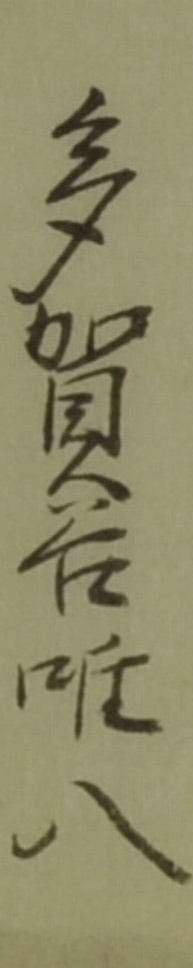多賀谷唯八
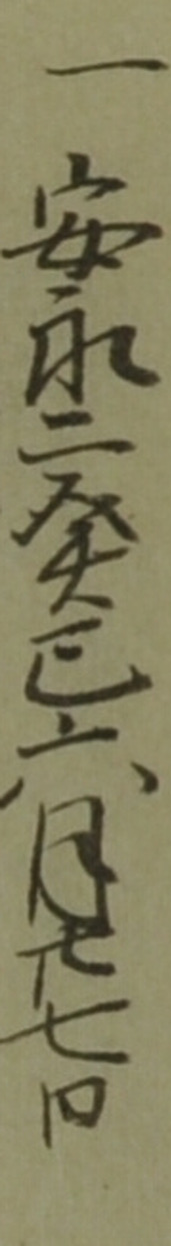一安永二癸巳六月廿七日
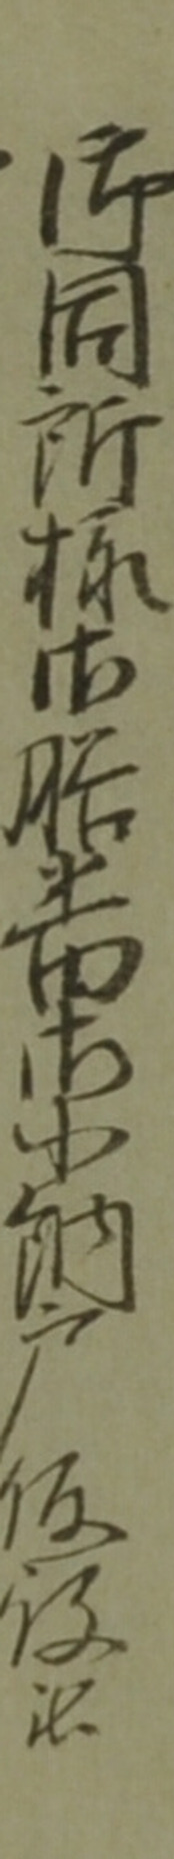御同所様御膳番御小納戸仮役被
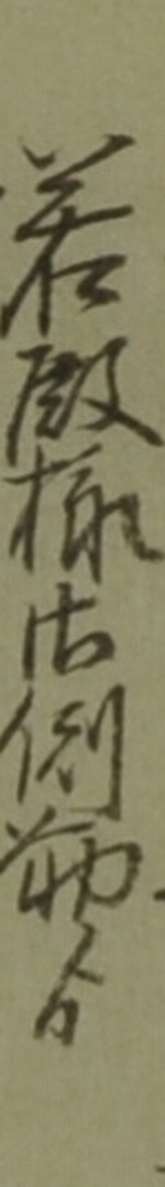若殿様御側勤ゟ
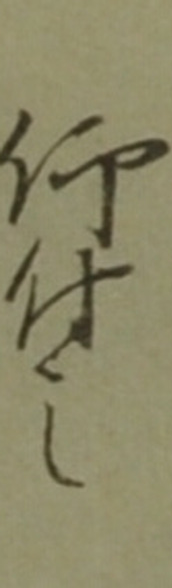仰付之
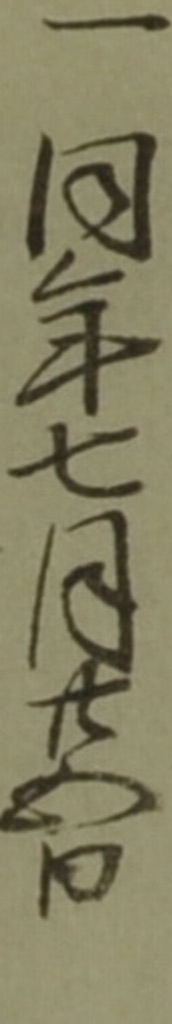一同年七月廿五日
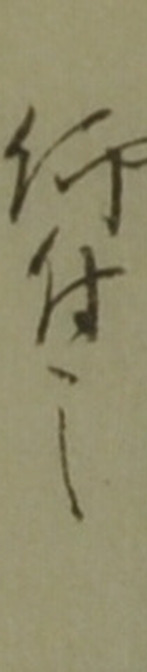仰付之
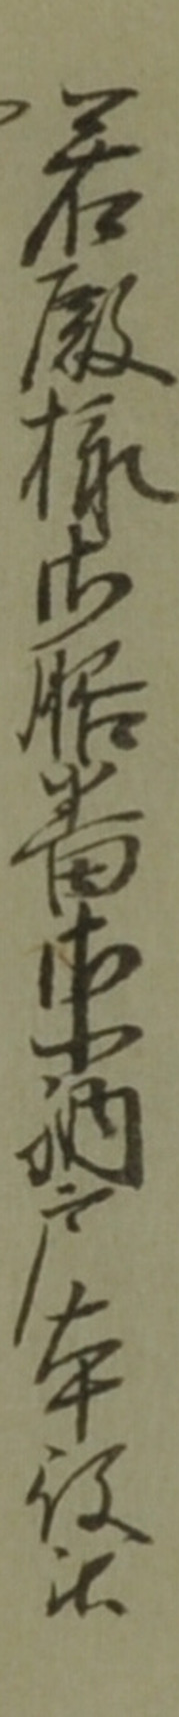若殿様御膳番御小納戸本役被
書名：諸御役代々録（四）
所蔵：伊那市立高遠町図書館・合同会社AMANE
